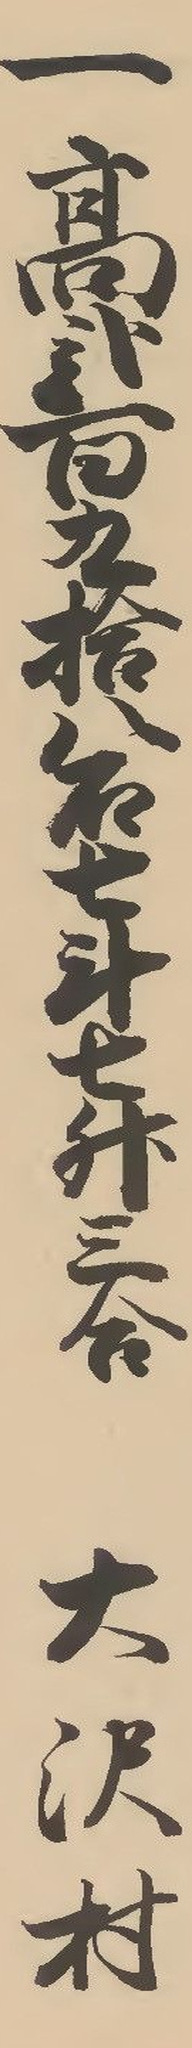一高弐百九拾八石七斗七升三合大沢村
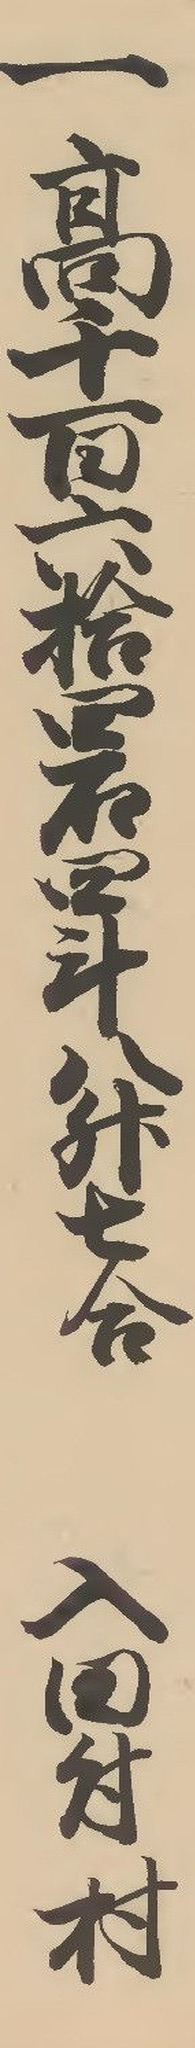一高千百六拾四石四斗八升七合入田付村
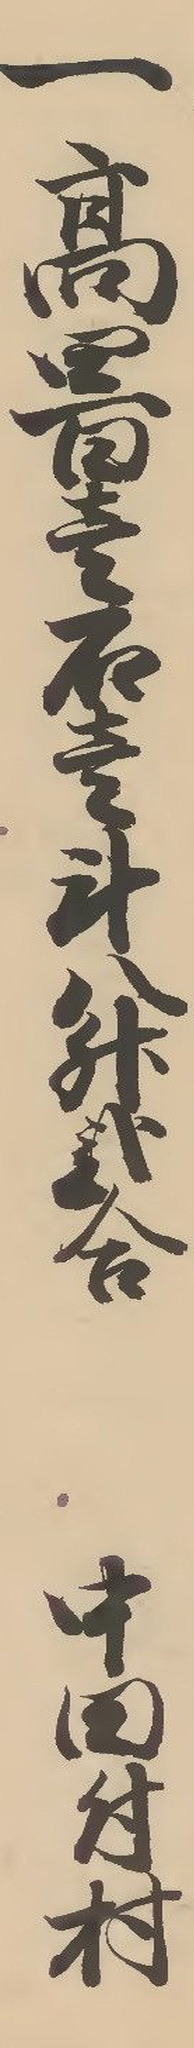一高四百壱石壱斗八升弐合中田付村

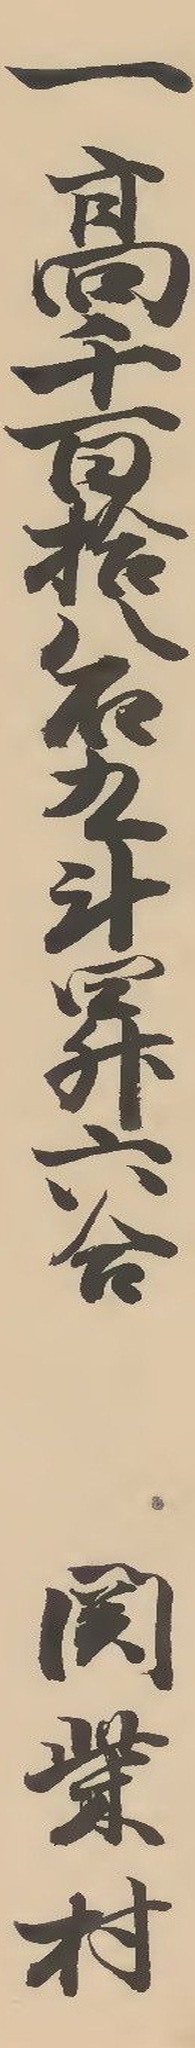一高千百拾八石九斗四升六合関柴村
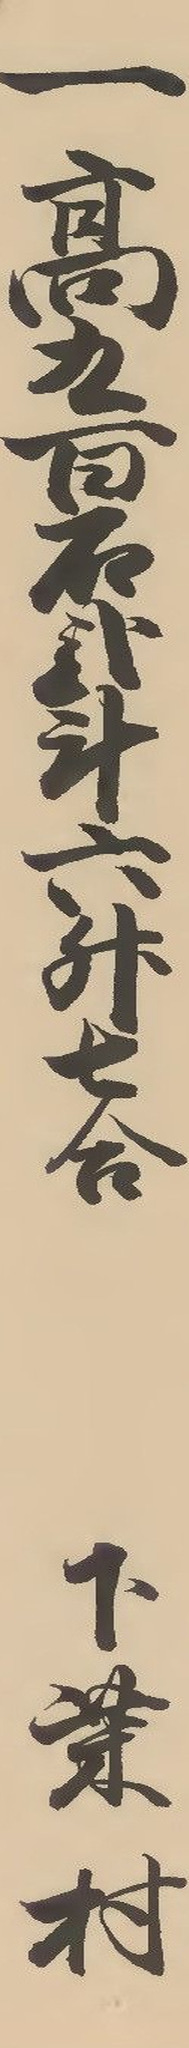一高九百石弐斗六升七合下柴村
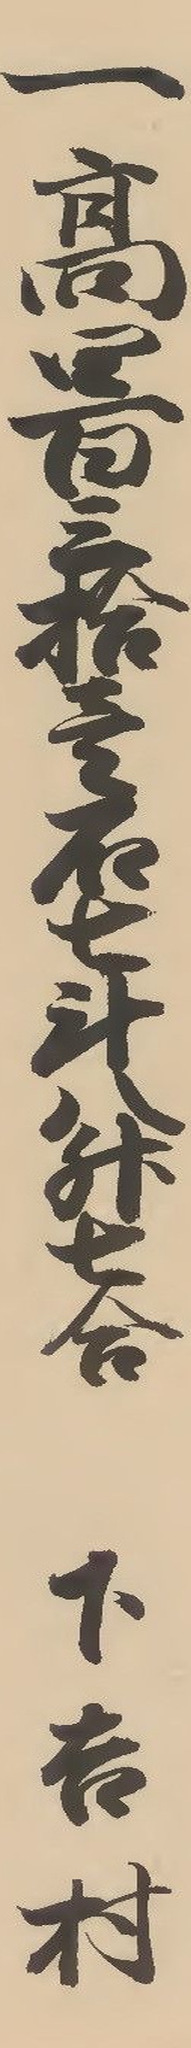一高四百三拾壱石七斗八升七合下吉村
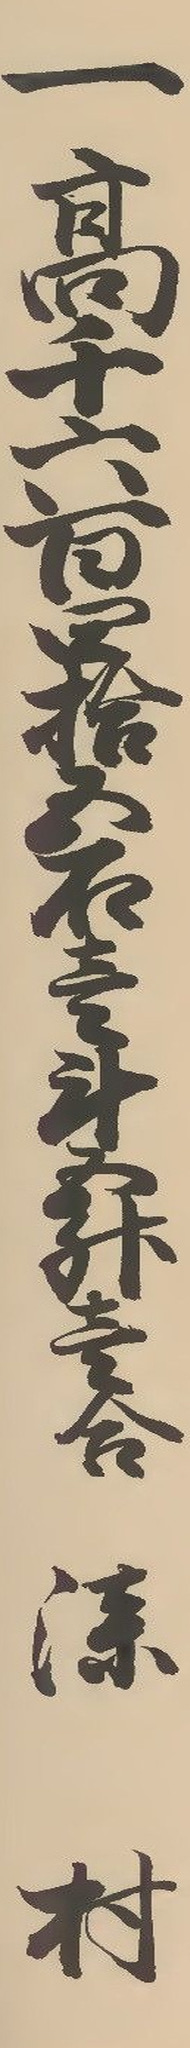一高千六百四拾五石壱斗五升壱合漆村
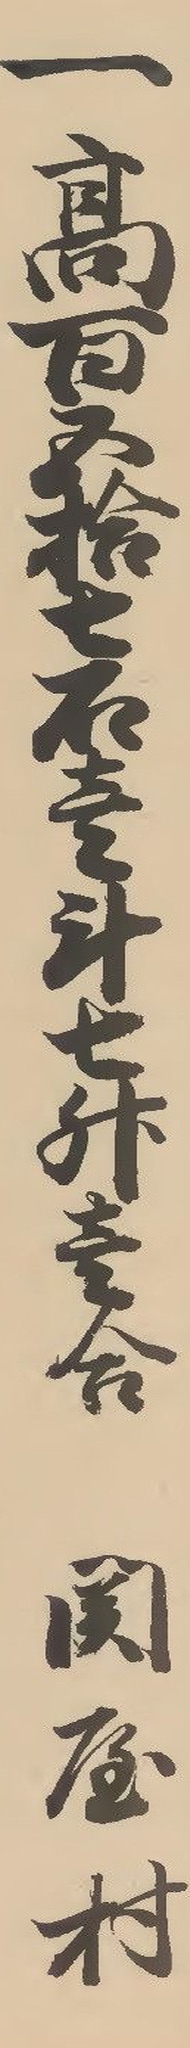一高百五拾七石壱斗七升壱合関屋村
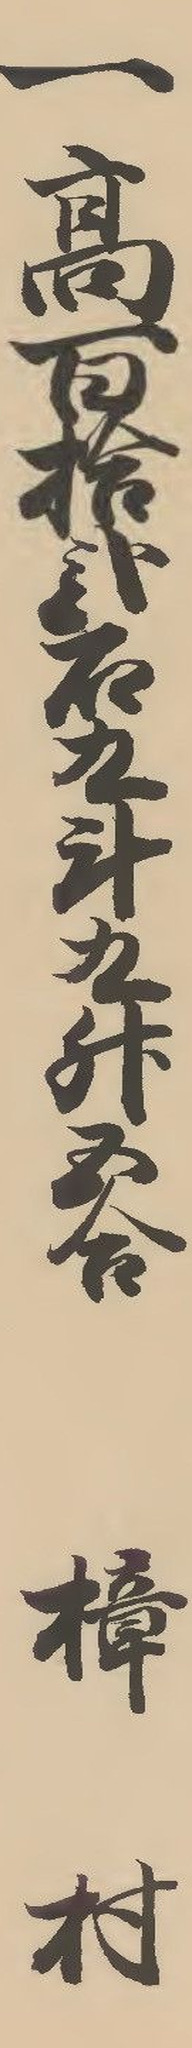一高百拾弐石九斗九升五合樟村
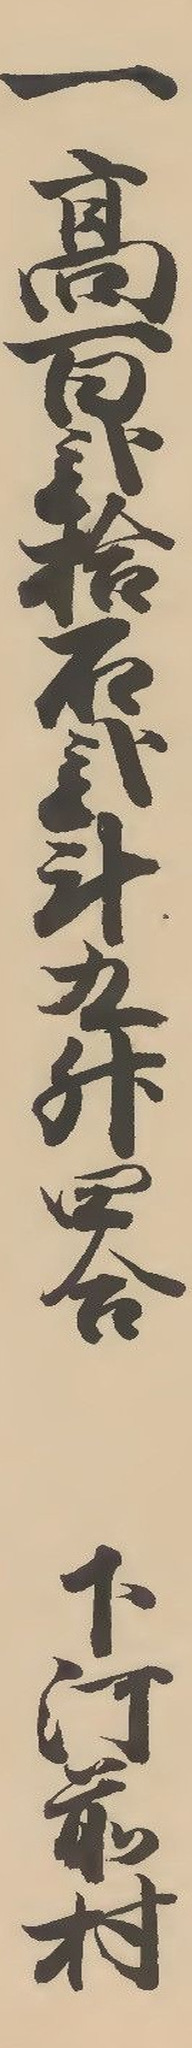一高百弐拾石弐斗九升四合下河前村
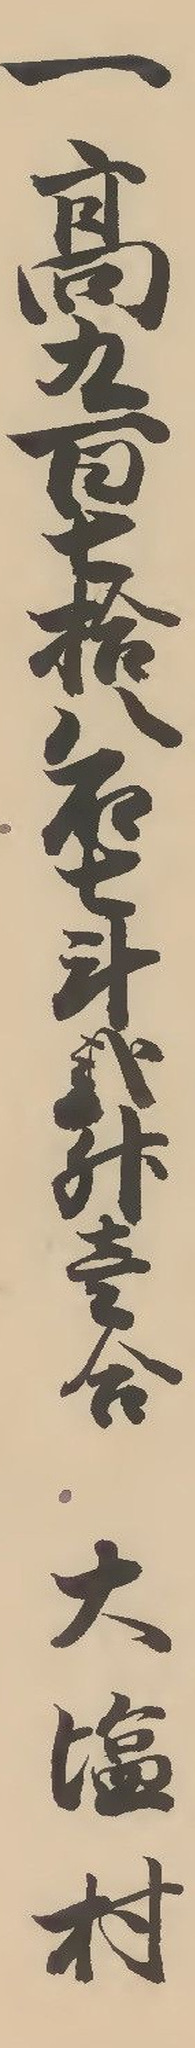一高九百七拾八石七斗弐升壱合大塩村

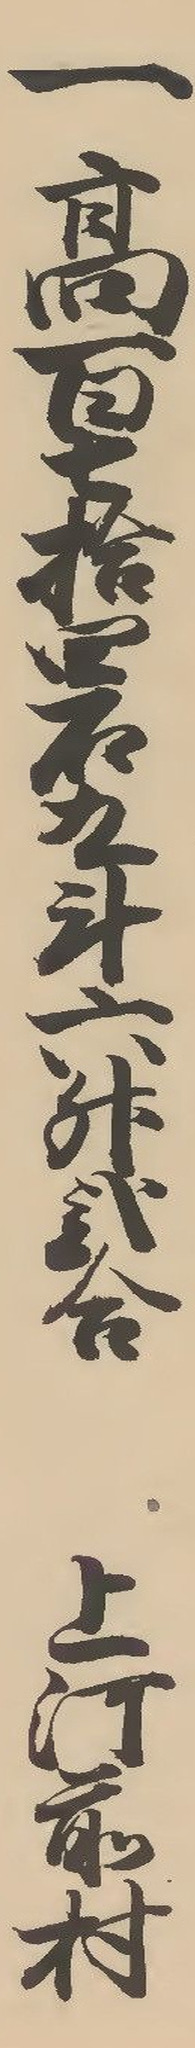一高百七拾四石九斗六升弐合上河前村
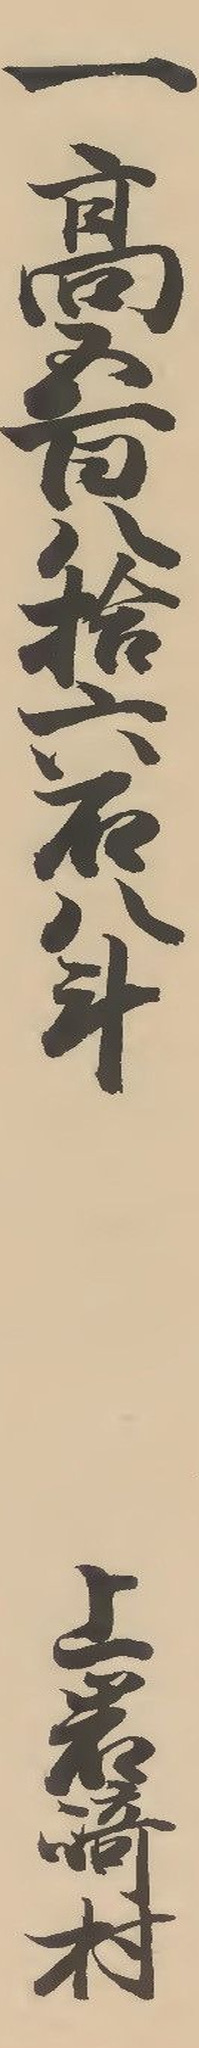一高五百八拾六石八斗上岩崎村
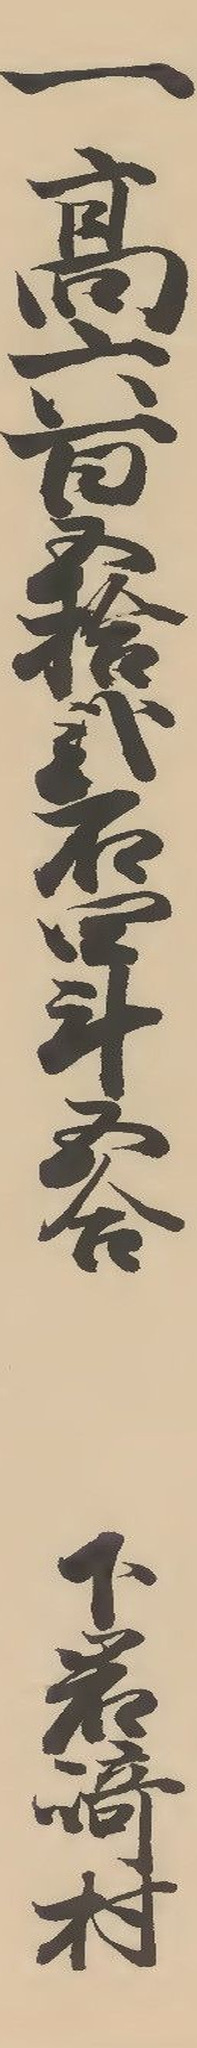一高六百五拾弐石四斗五合下岩崎村
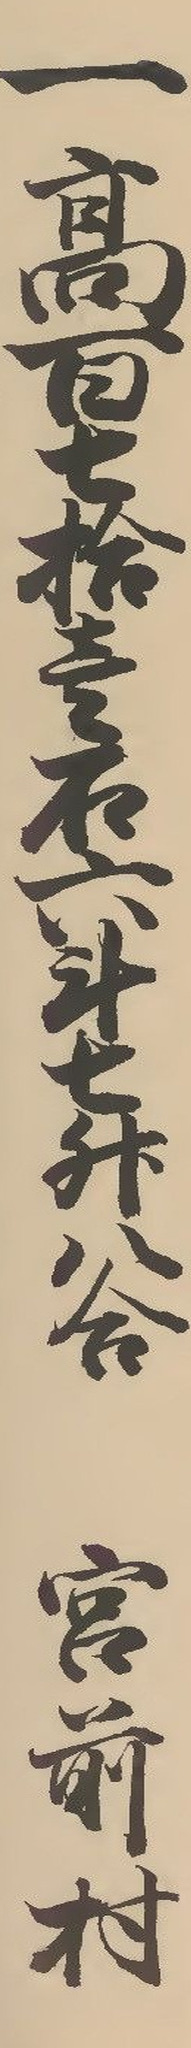一高百七拾壱石六斗七升八合宮前村
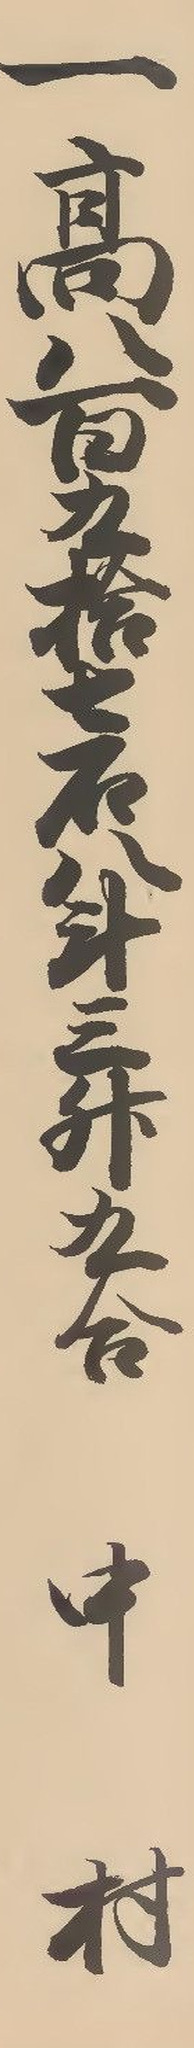一高八百九拾七石八斗三升九合中村
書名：陸奥国郷帳　１
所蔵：国立公文書館 National Archives of Japan
